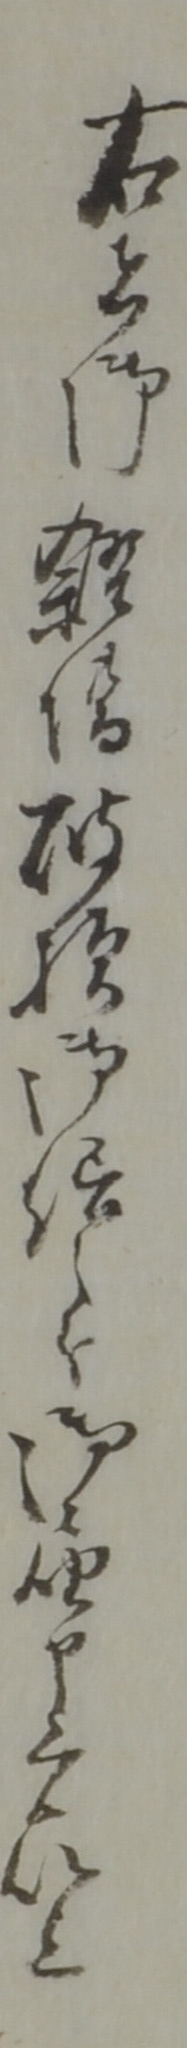右者御糴借破損御繕之分御届申上候以上
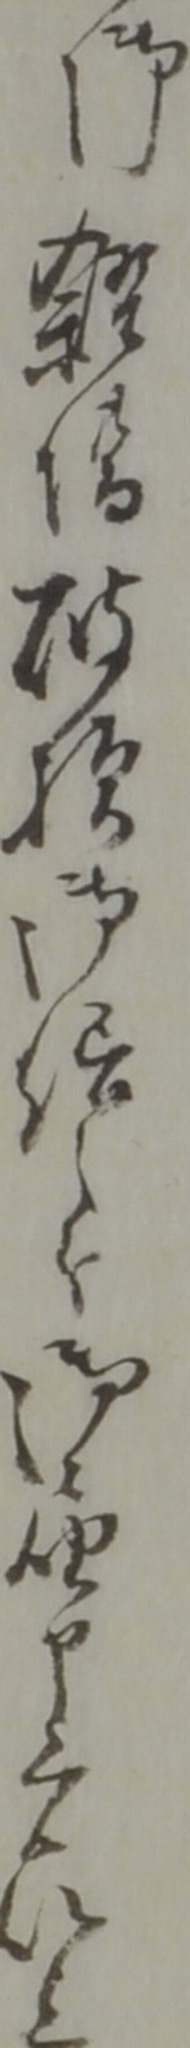右者御糴借破損御繕之分御届申上候以上
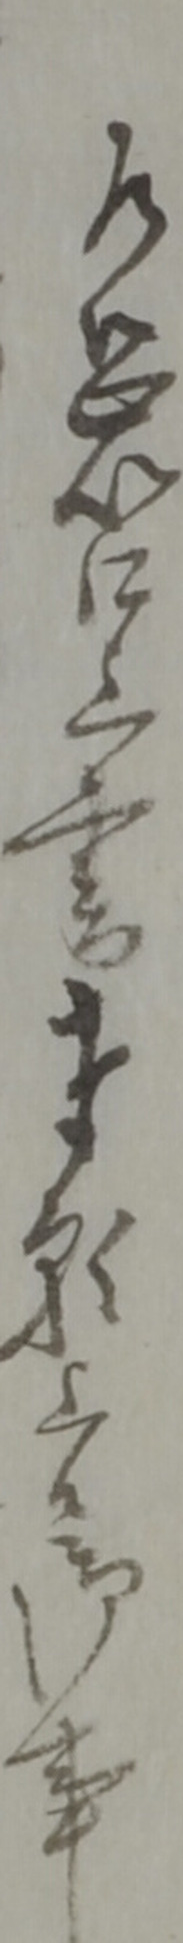乍恐以口上書奉願上候御事
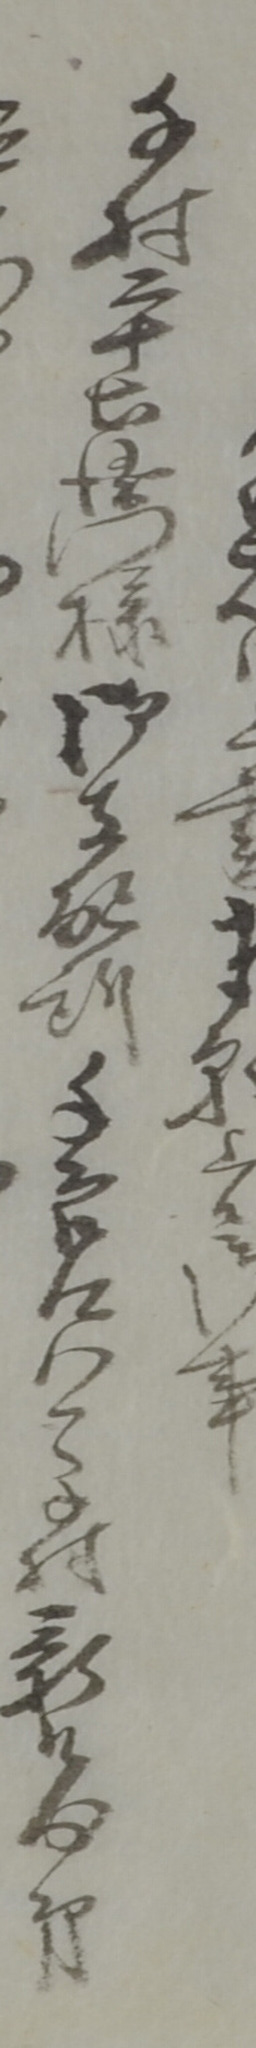千村平右衛門様御支配所手良郷八手村新左衛門弟
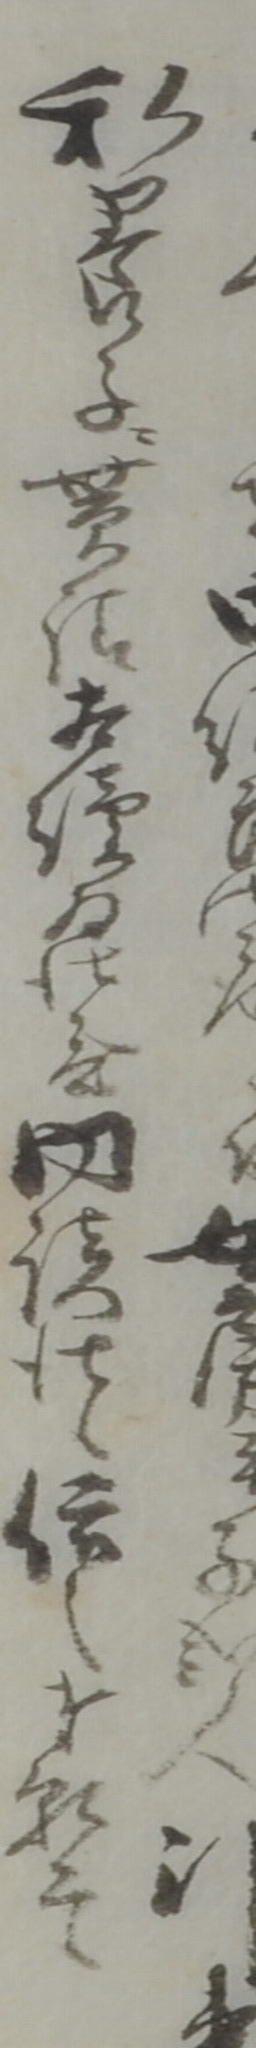私養子ニ貰請相続為仕度内談仕候依之奉願上候

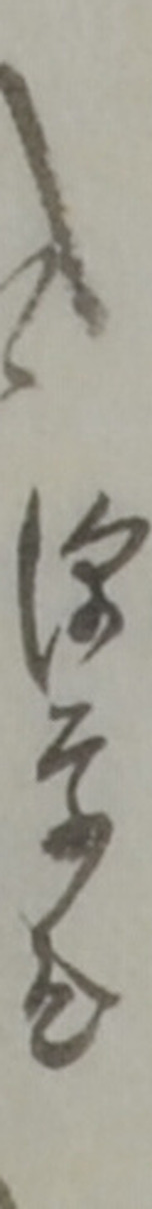深草屋
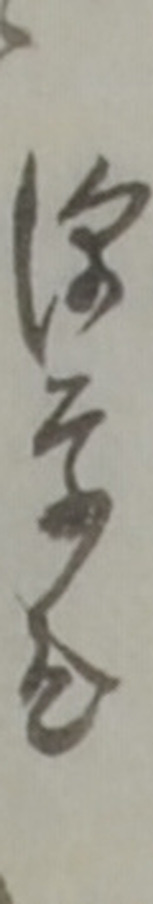深草屋
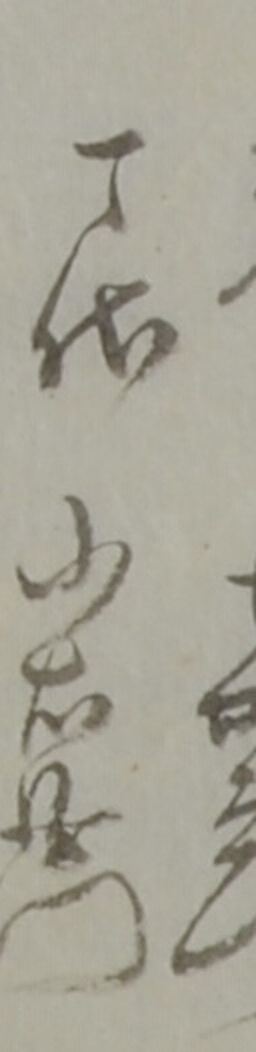丁代小右衛門
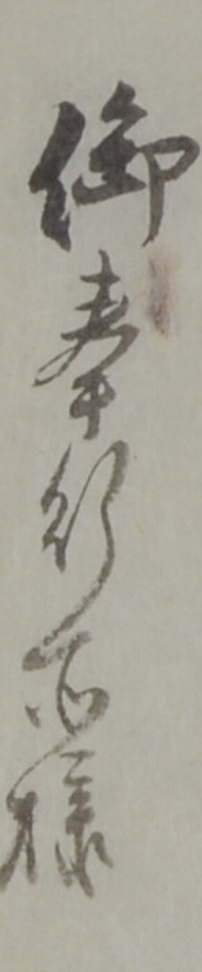御奉行所様
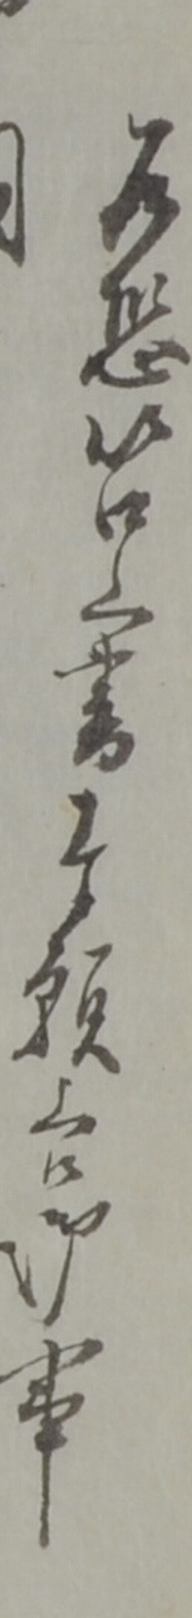乍恐以口上書奉願上候御事
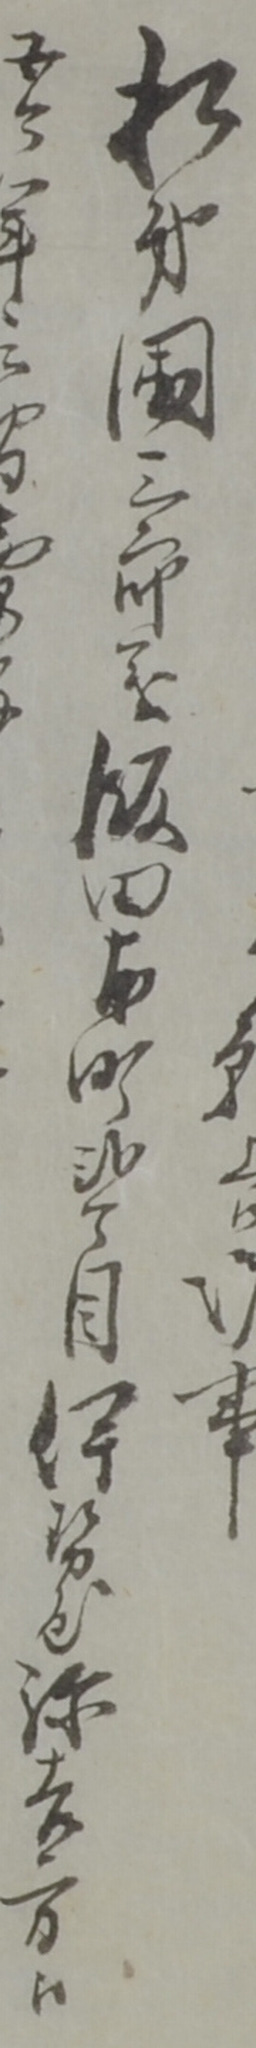私弟国三郎義飯田本町弐丁目伊勢屋弥吉方江
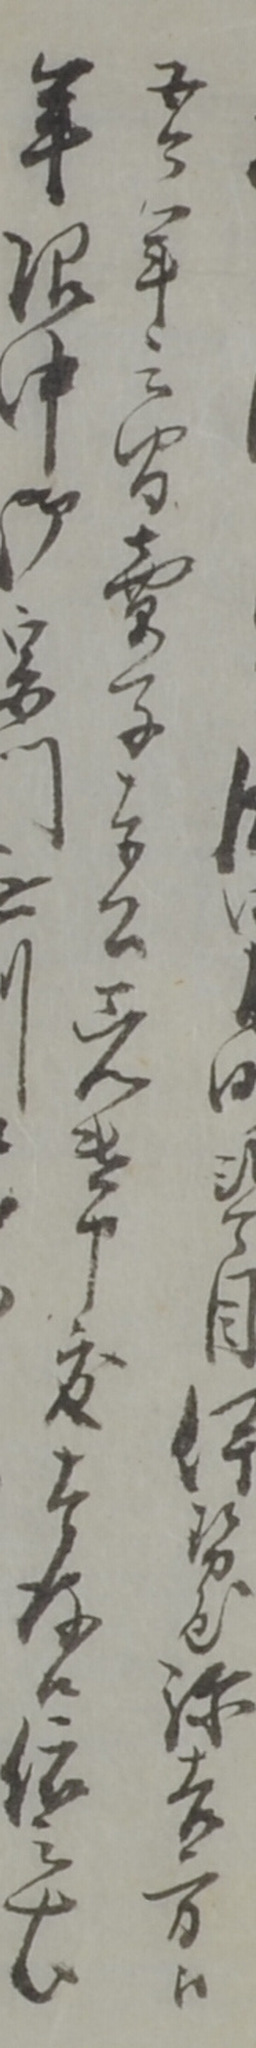五ヵ年之間売子奉公差遣申度奉存候依之右
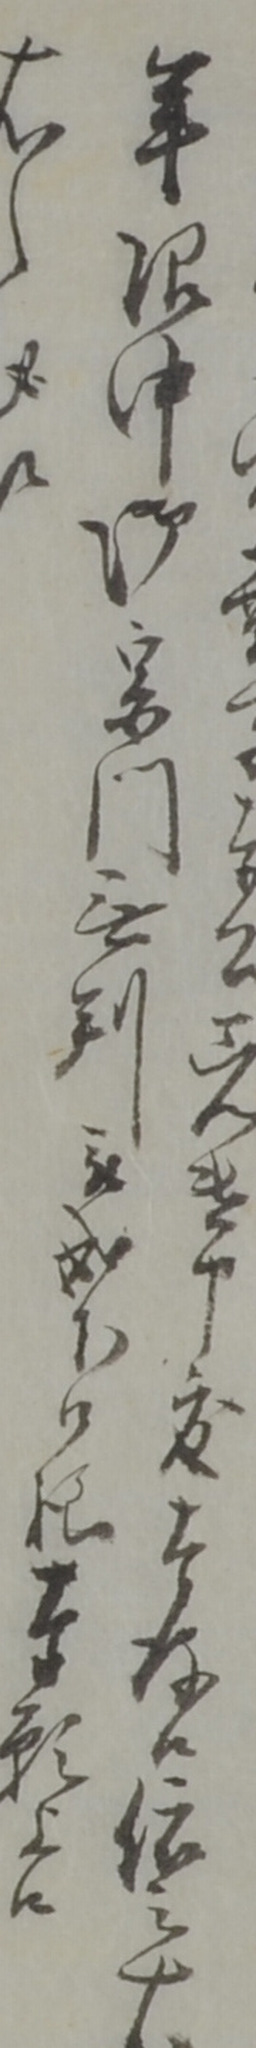年限中御宗門無判被成下候様奉願上候
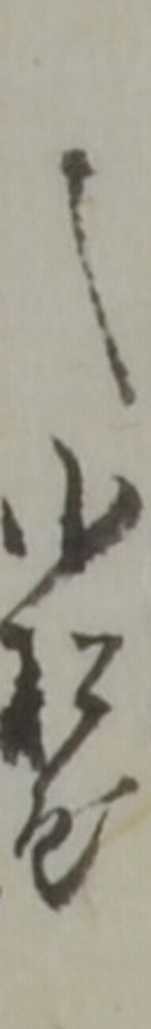小松屋
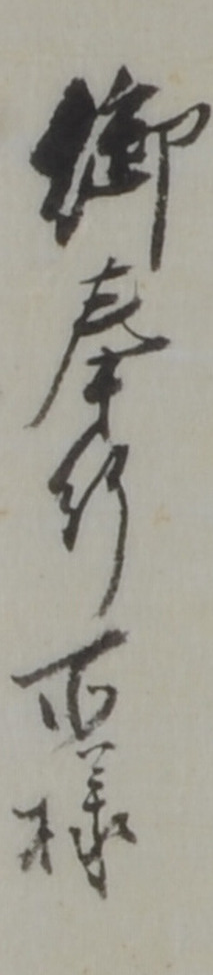御奉行所様
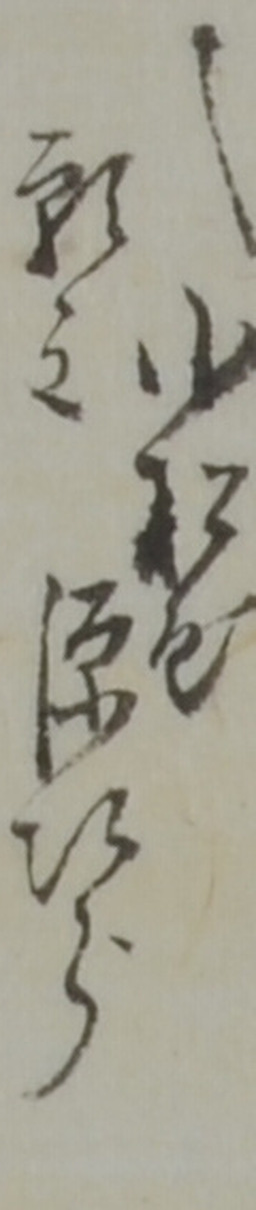願主源次郎
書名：諸願書控簿
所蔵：伊那市立高遠町図書館・合同会社AMANE
